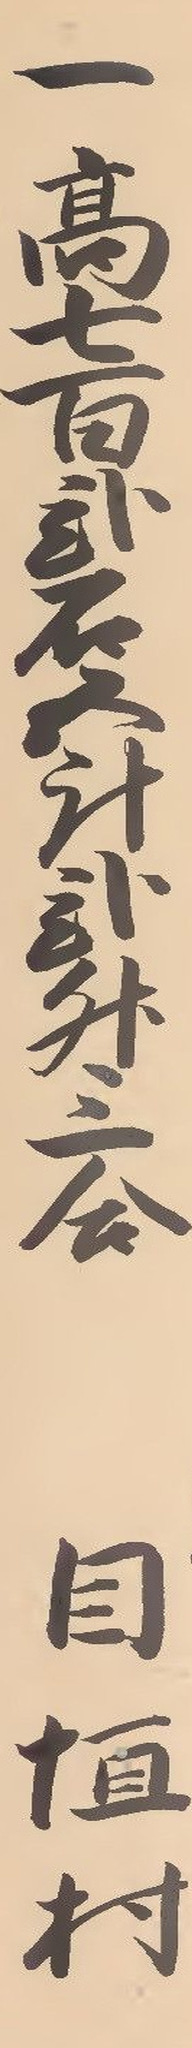一高七百弐石五斗弐升三合目垣村
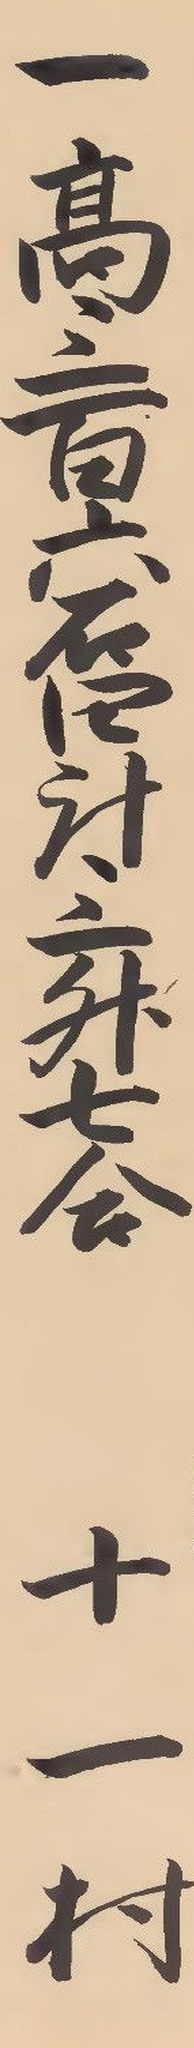一高三百六石四斗三升七合十一村
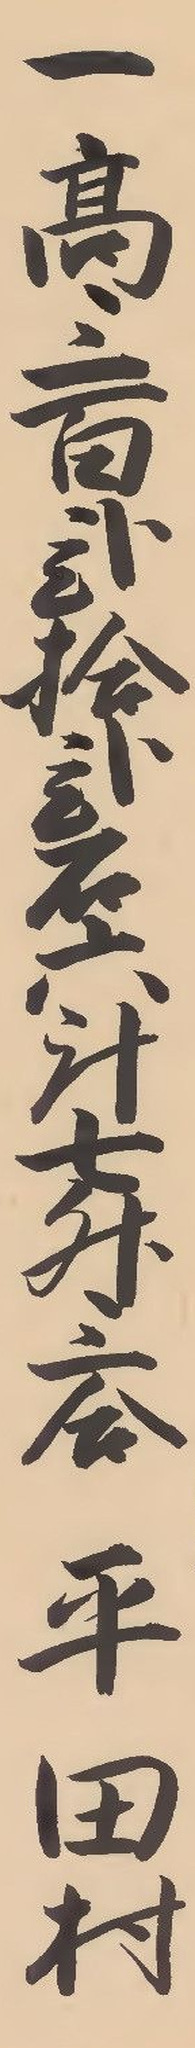一高三百弐拾弐石六斗七升三合平田村
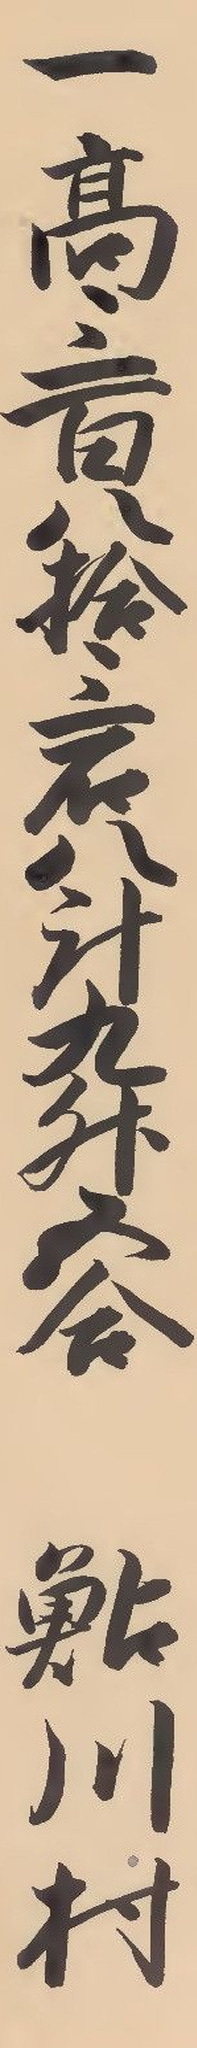一高三百八拾三石八斗九升五合鮎川村

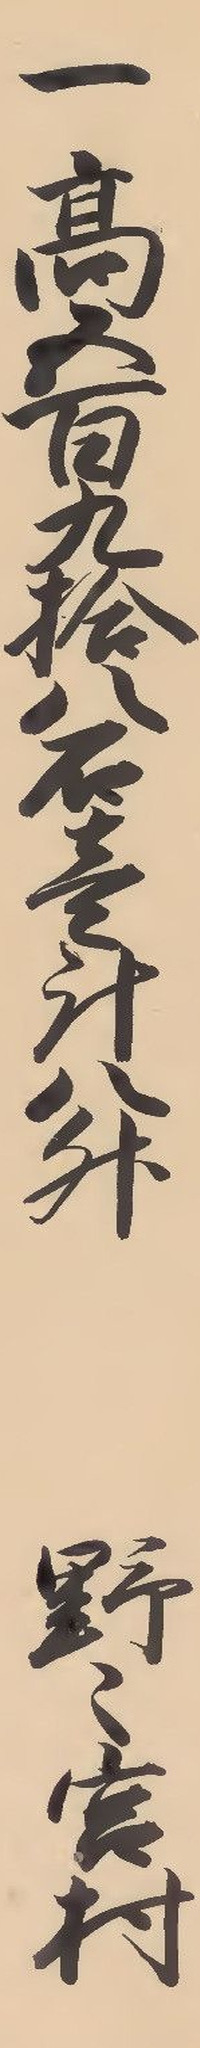一高五百九拾八石壱斗八升野々宮村
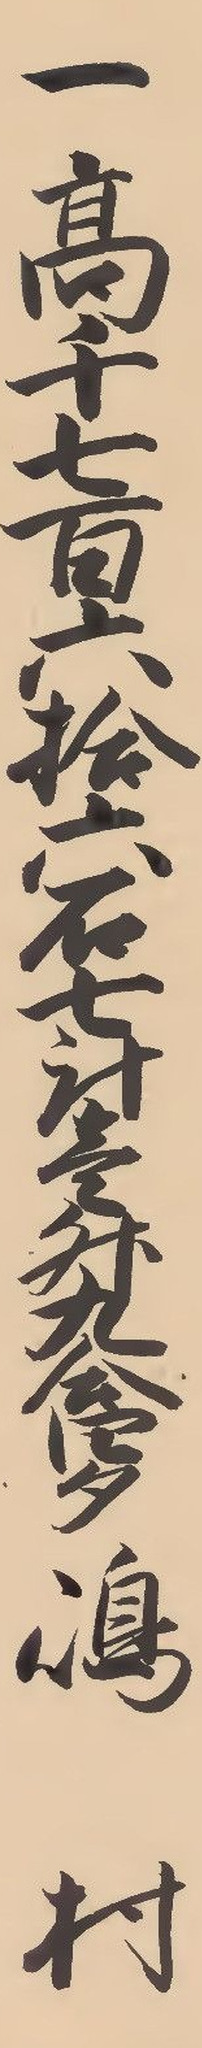一高千七百六拾六石七斗壱升九合四勺嶋村
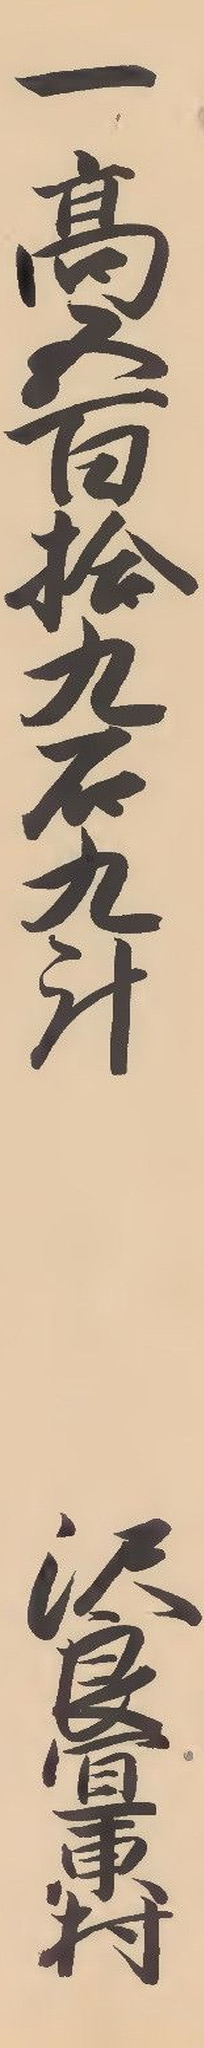一高五百拾九石九斗沢良宜東村
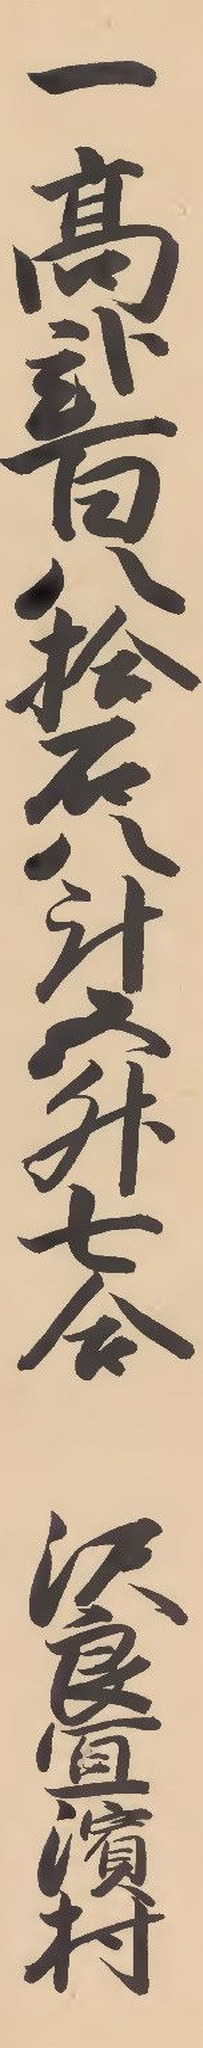一高弐百八拾石八斗五升七合沢良宜濱村
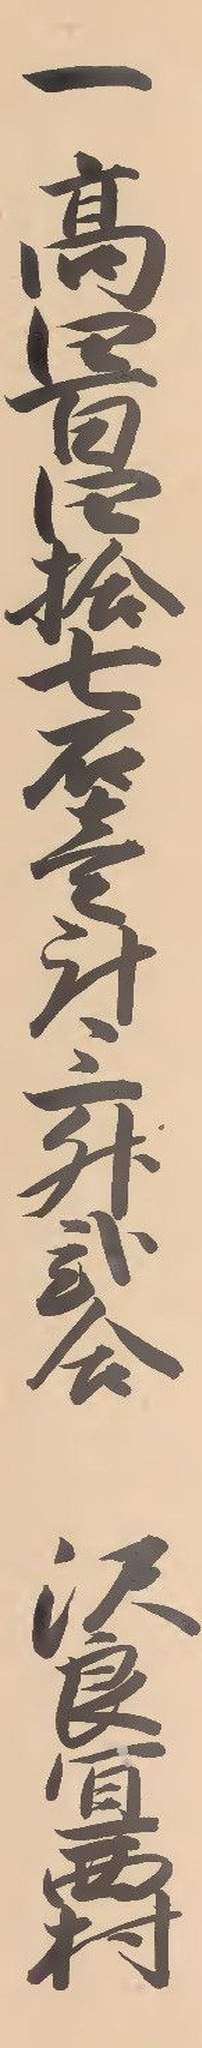一高四百四拾七石壱斗三升弐合沢良宜西村
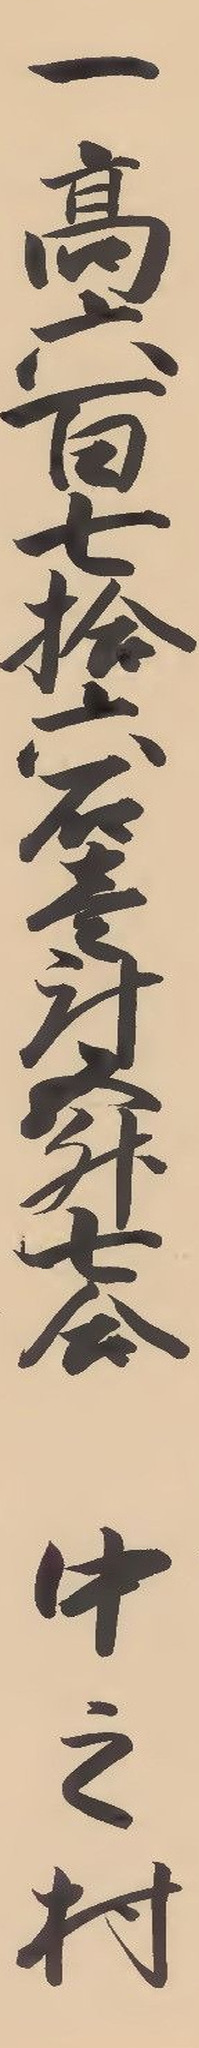一高六百七拾六石壱斗五升七合中之村
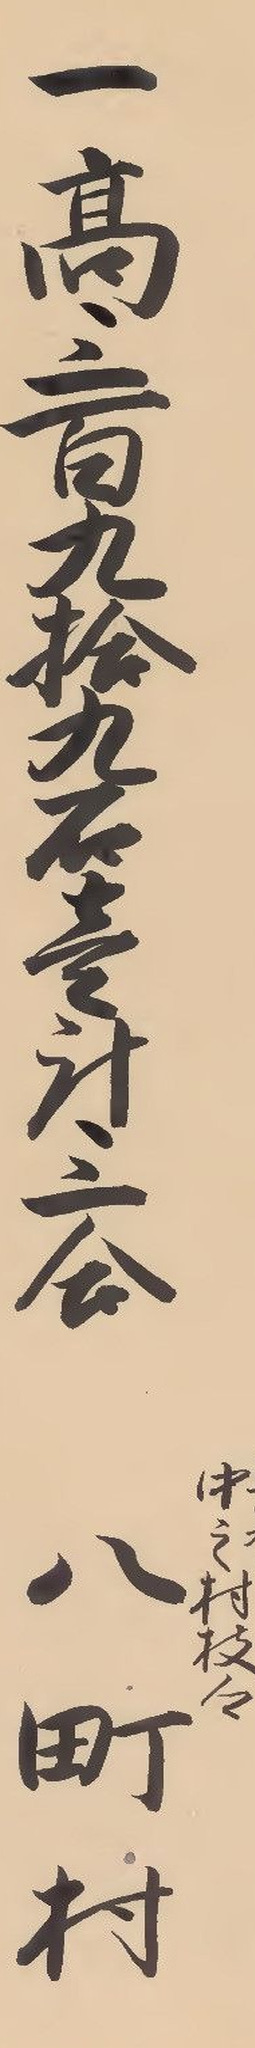一高三百九拾九石壱斗三合八町村

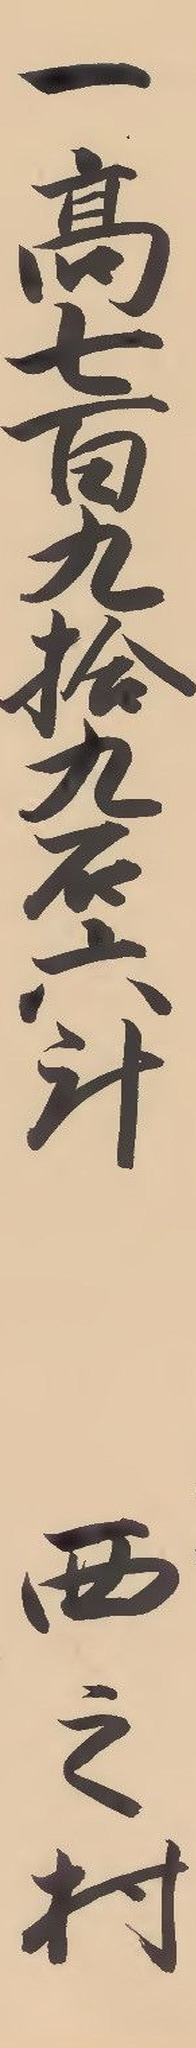一高七百九拾九石六斗西之村
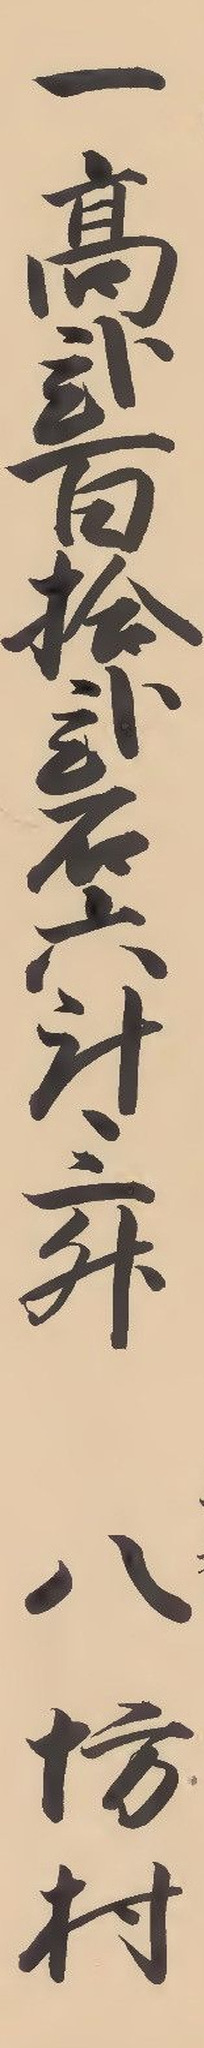一高弐百拾弐石六斗三升八坊村
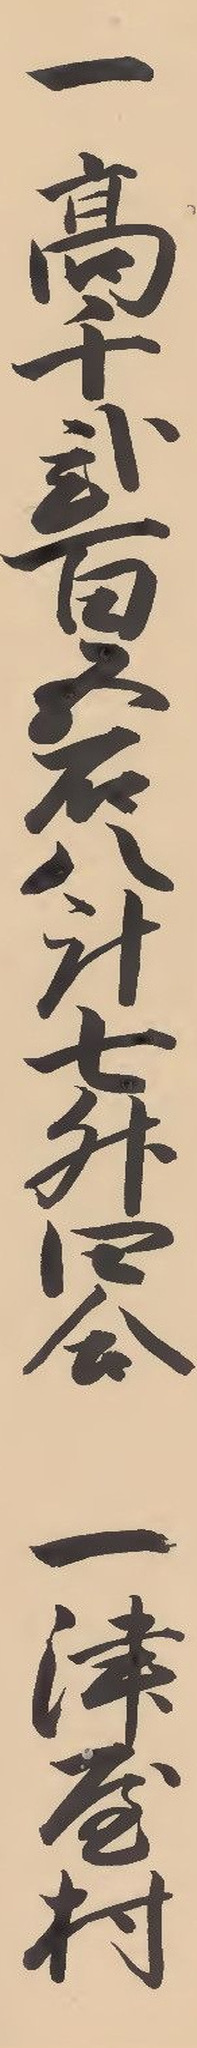一高千弐百五石八斗七升四合一津屋村
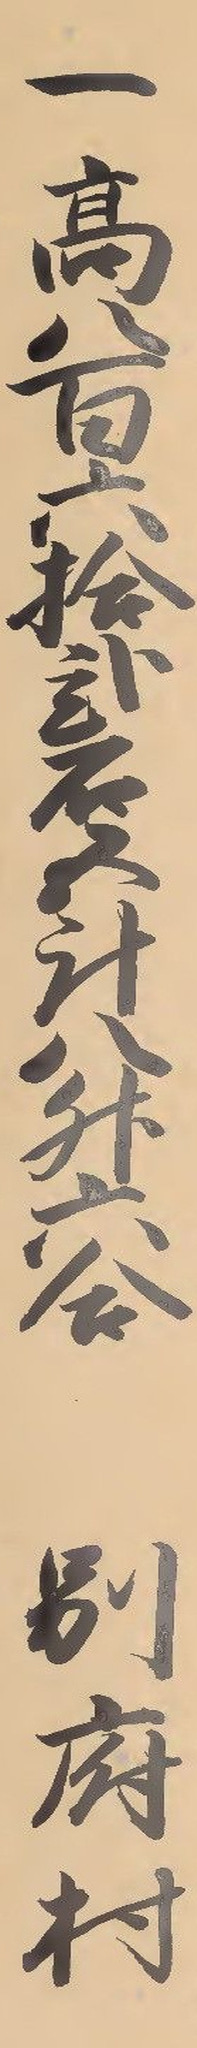一高八百六拾弐石五斗八升六合別府村
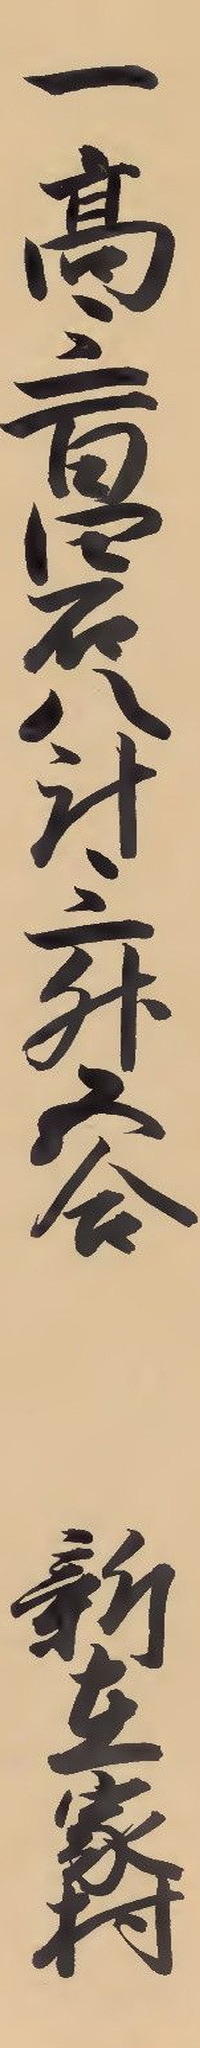一高三百四石八斗三升五合新在家村
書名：摂津国郷帳
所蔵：国立公文書館 National Archives of Japan
